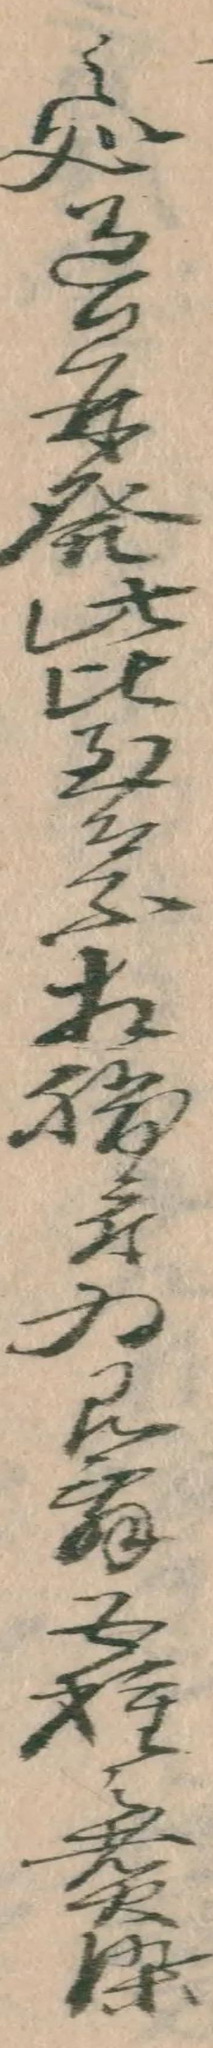之処過日再発此比至而不相勝ニ付為見舞五種之煮染
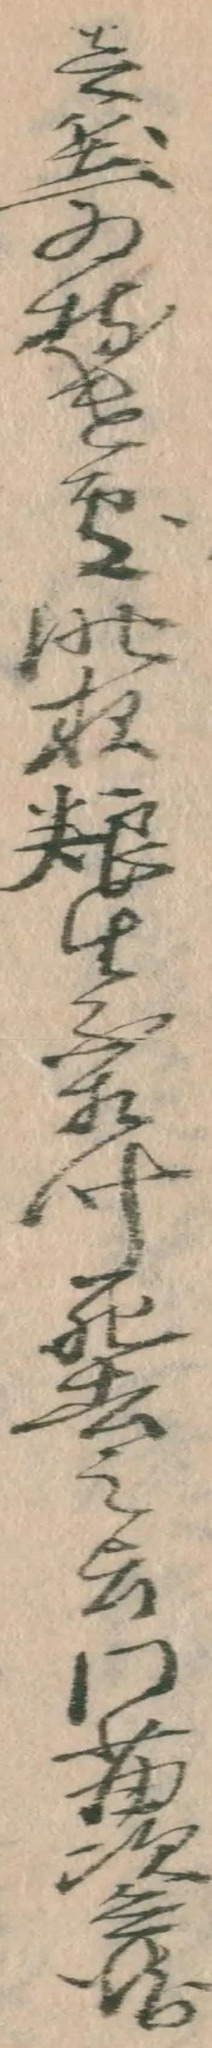壱器為持遣處昨夜養生不相叶死去之旨同苗次兵衛
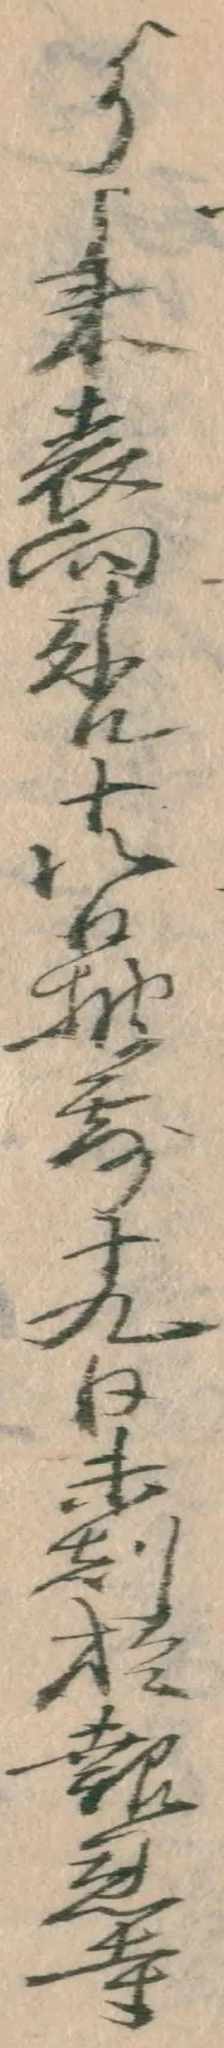より申来表向来ル十八日披露十九日未刻於報恩寺
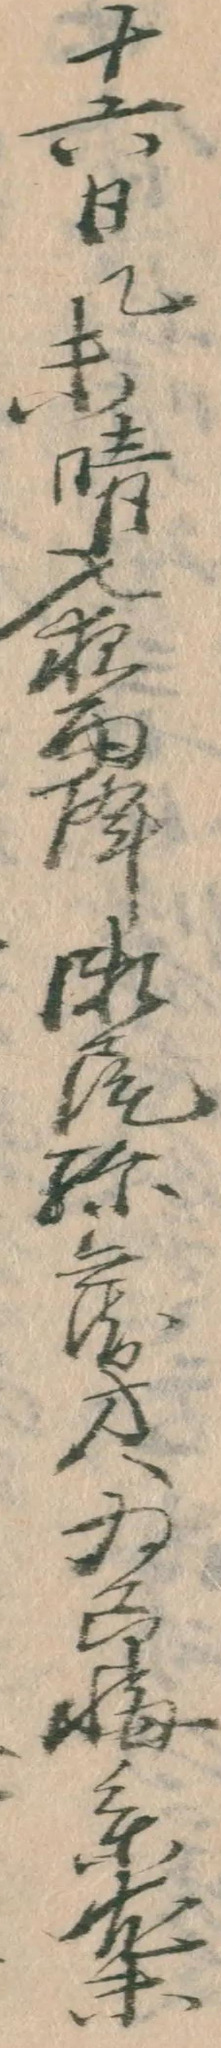十六日乙未晴入夜雨降瀬尾弥兵衛方へ為弔悔参尤未
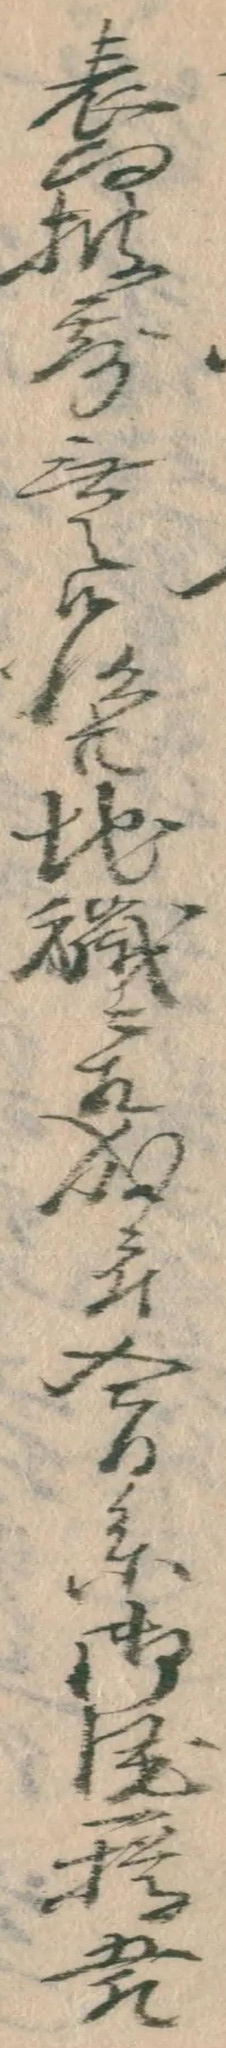表向披露無之候得共地穢ニ相成ニ付今日参御一樽五升
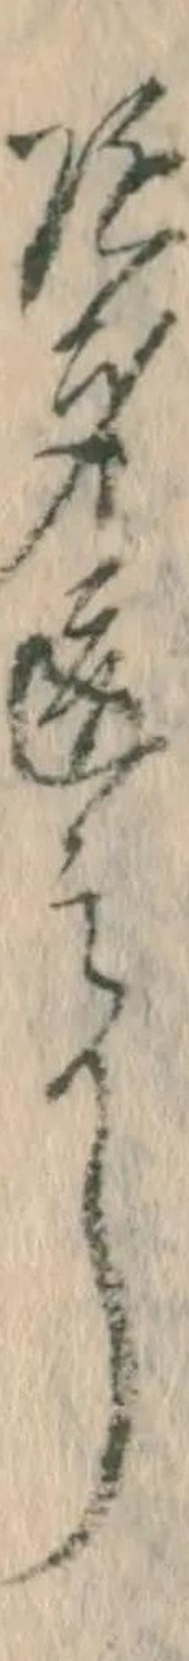随身送之事
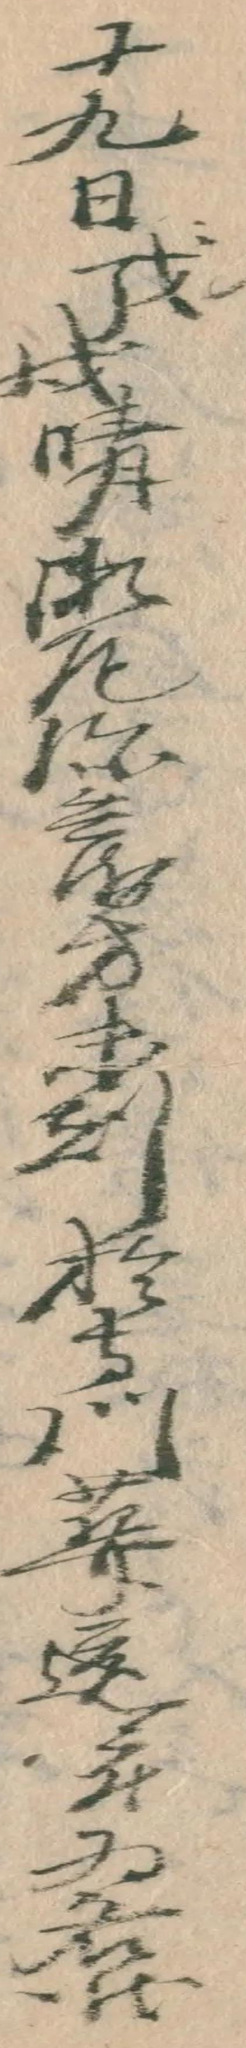十九日戊戌晴瀬屋弥兵衛方未刻於寺門葬送ニ付為名代
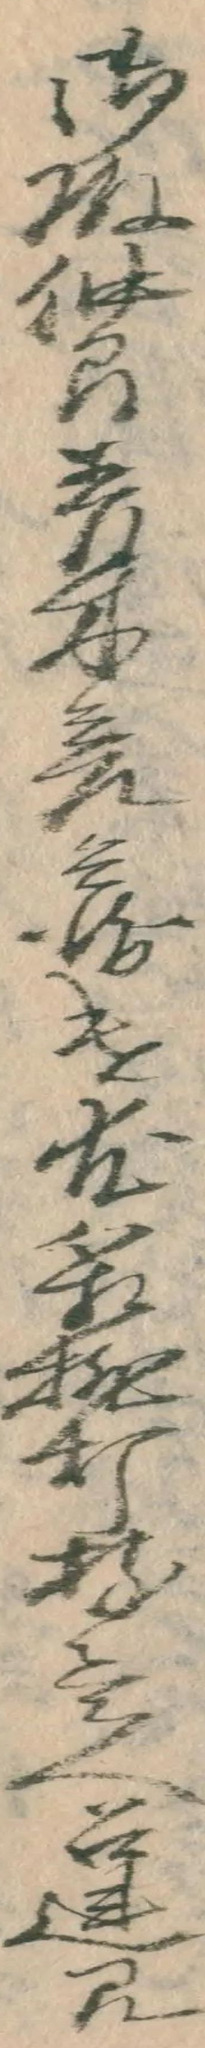御殿仲間青木彦兵衛遣尤箱挑灯持壱人召連見
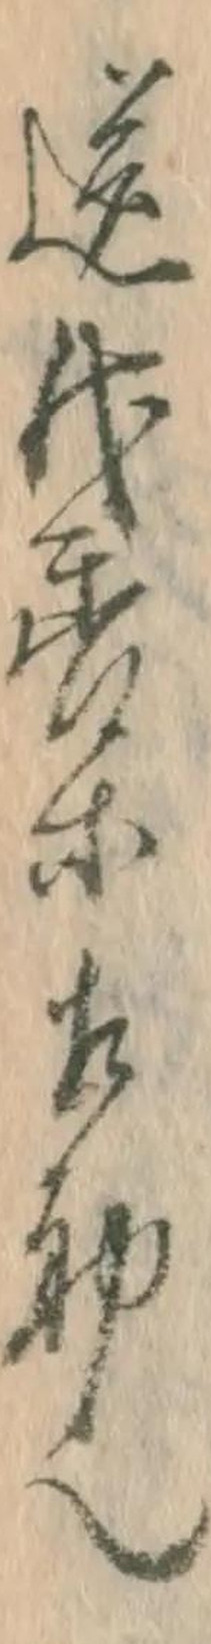送代香等相勤也

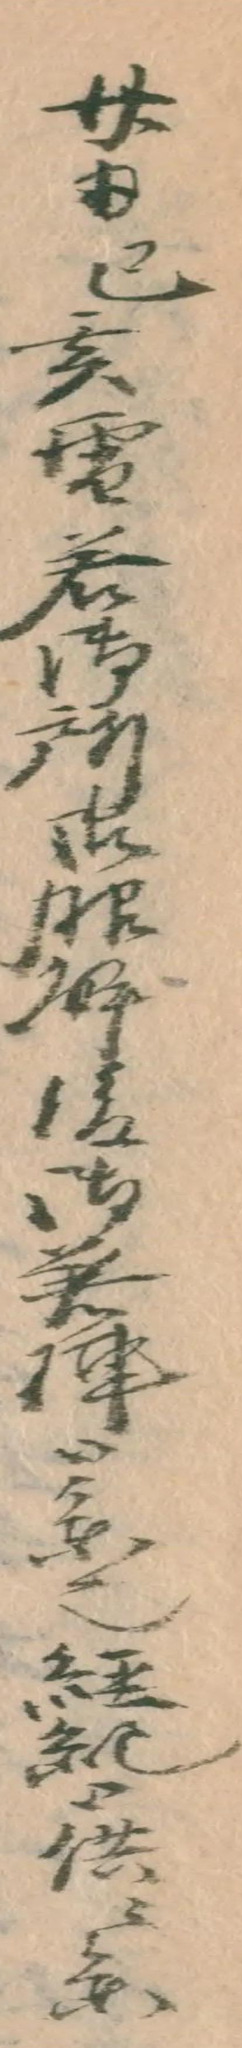廿日己亥雪若御所御服解後御着陣御参也経紀御供ニ参
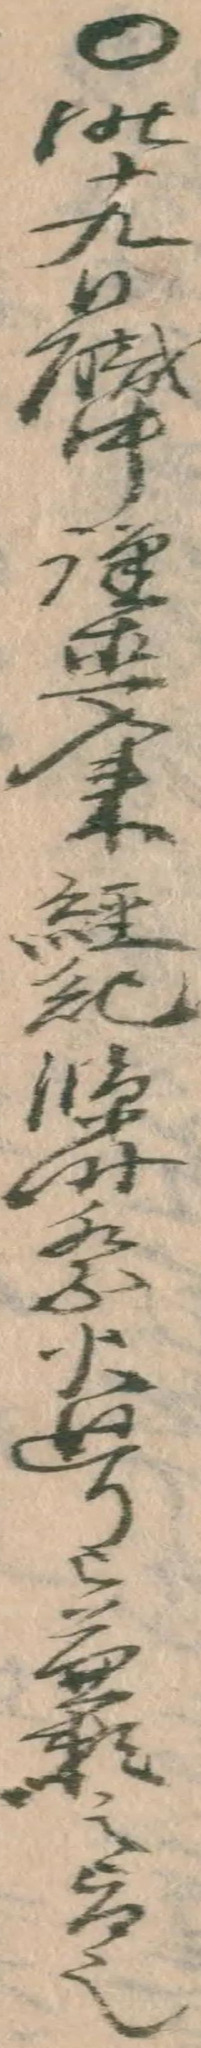○昨十九日職中謹直入来経紀臨時祭火廻り被兼頼之旨也
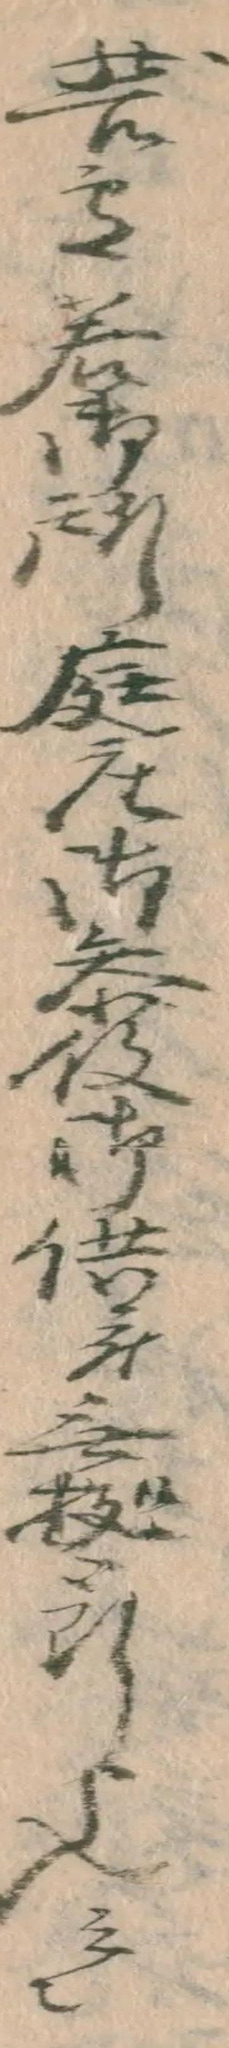然候處若御所庭座御参役御供ニ付無拠御断申入云々
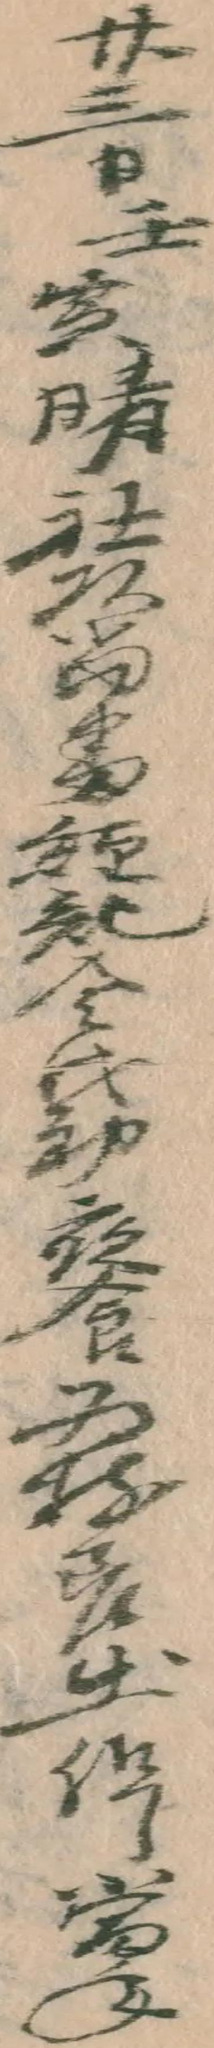廿三日壬寅晴社頭當番経紀令代勤夜食為持差出但し當年
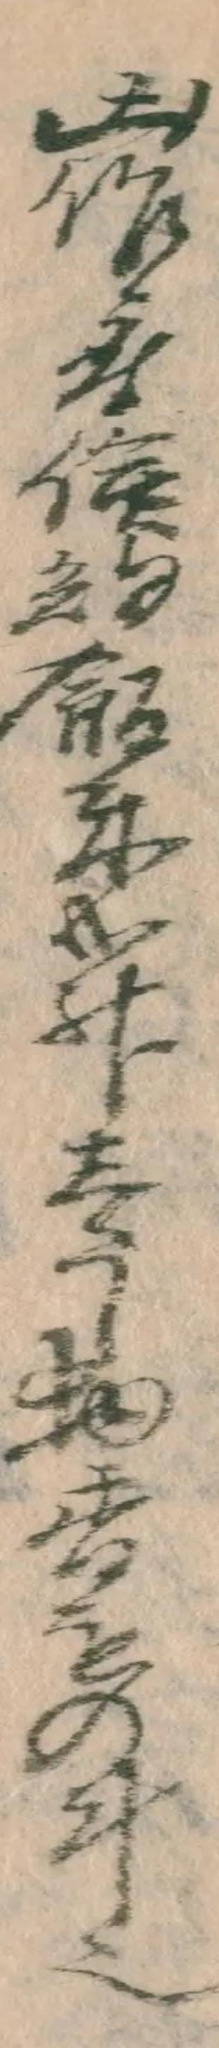凶作ニ付倹約飯米弐升壱つ物香もの斗也
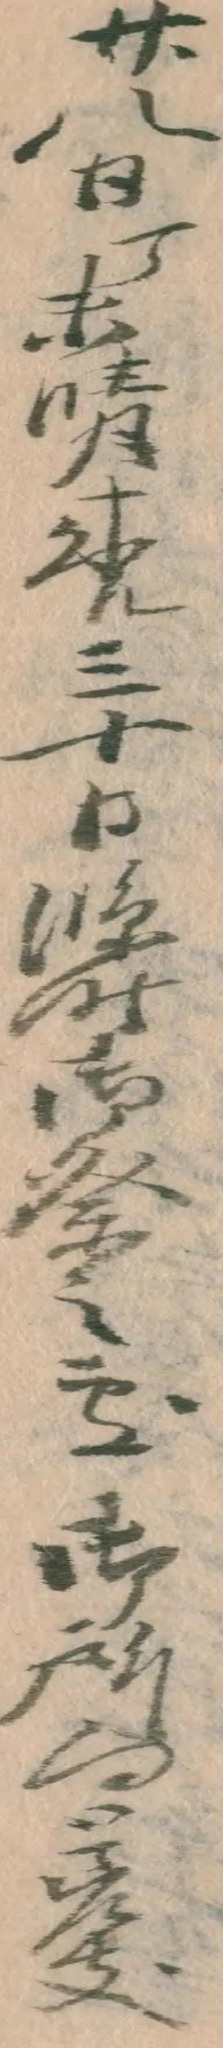廿八日丁未晴来ル三十日臨時御祭之處御所向御差支
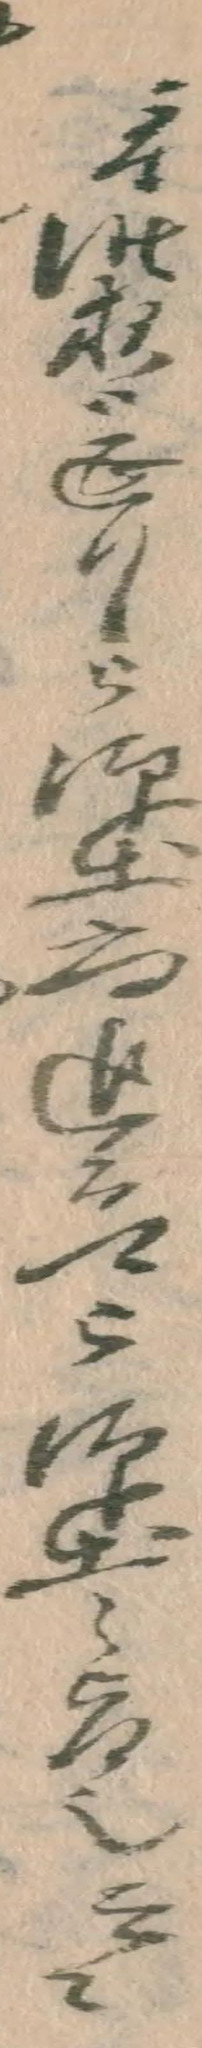ニ付昨夜ハ延引被仰出尚追而可被仰出之旨也云々
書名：賀茂社記録. 第67冊
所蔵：国立国会図書館 National Diet Library, JAPAN
